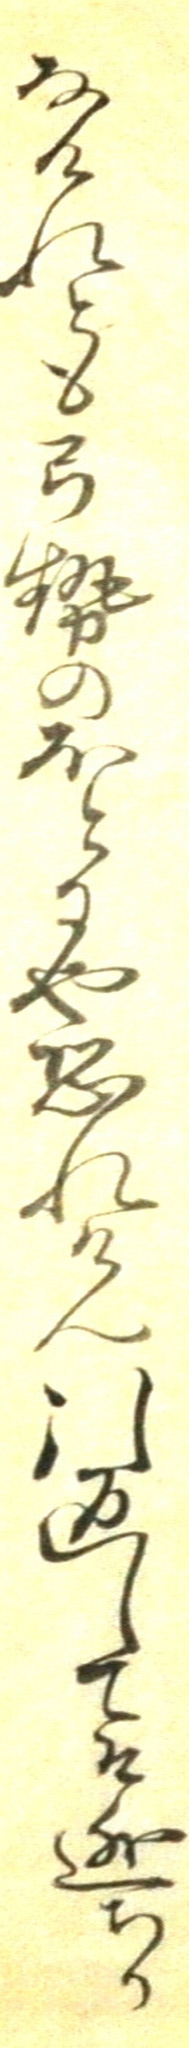なけれとも弓勢のほとにや恐れけん引返してそ逃ちり
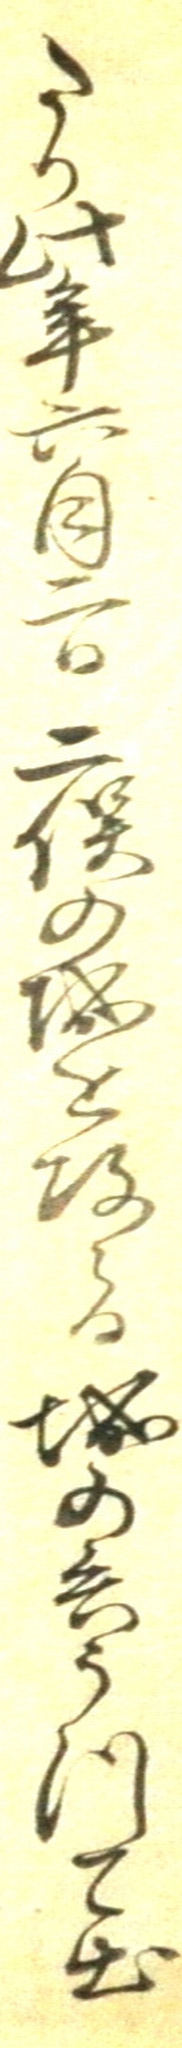たり此年六月二日二俣の城を攻る城の兵うつて出
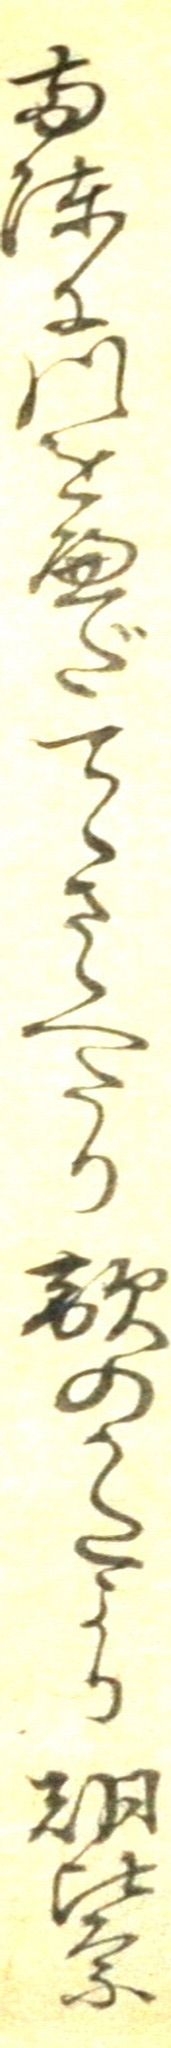両陣に川をへだてゝさゝへたり敵のかたより朝比奈
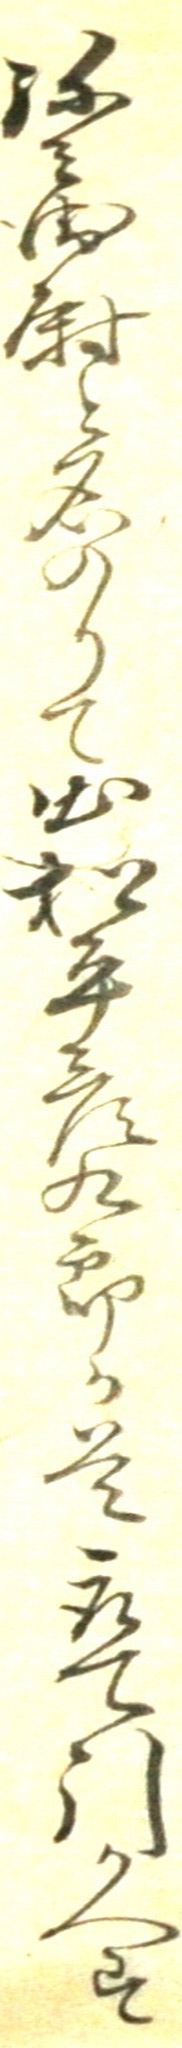弥兵衛尉と名のりて出松平彦九郎か首取て引かへす
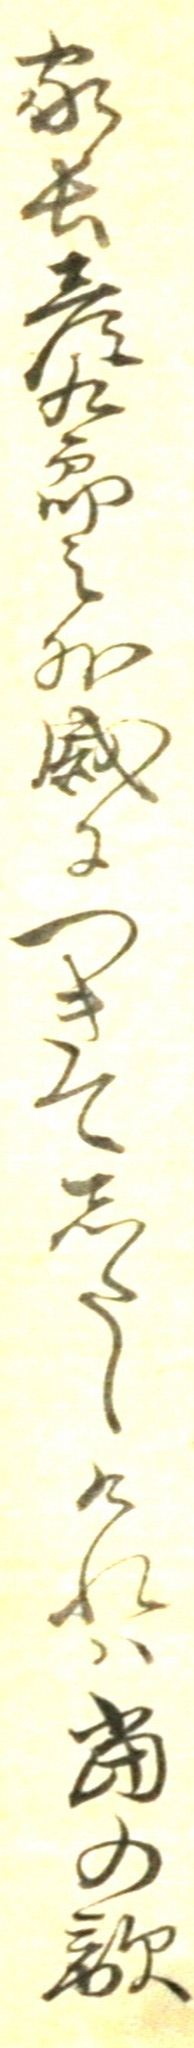家長彦九郎之外戚につきてしたしけれは当の敵
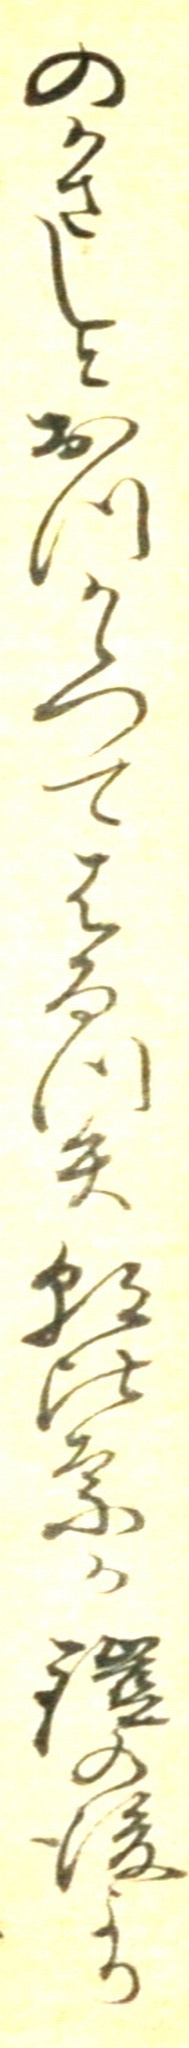のかさしとおつかゝつてはなつ矢朝比奈か鎧の後より
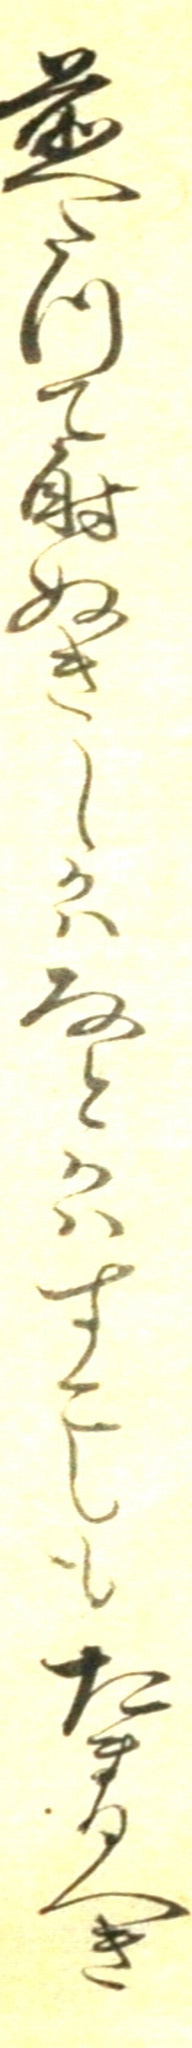前へたつて射ぬきしかはなとかはすこしもたまるへき
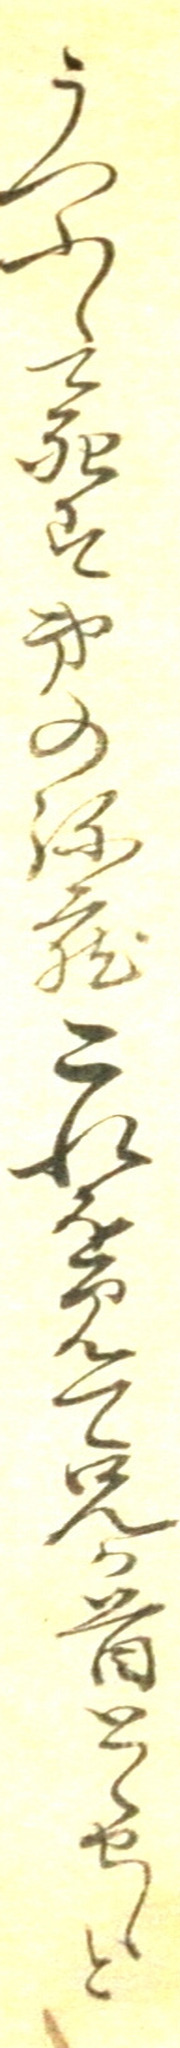うつふして死す弟の弥蔵これを見て兄か首とらせしと
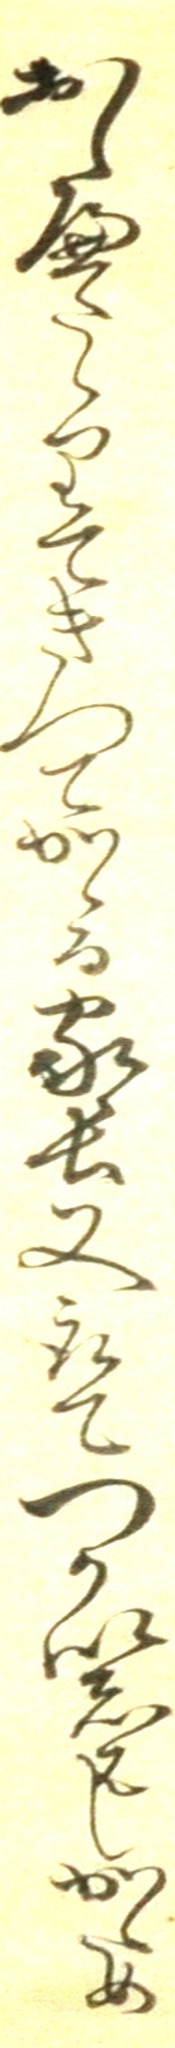おしへたゝりてきつてかゝる家長又取てつかいしはしかため
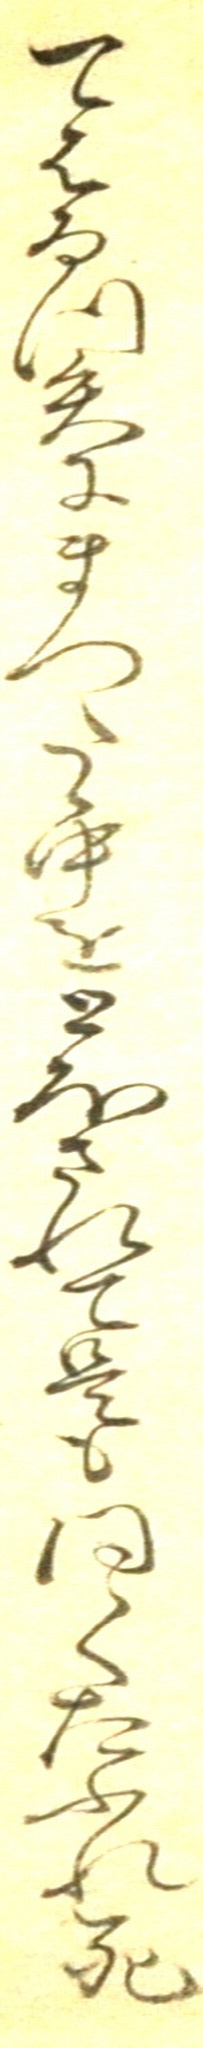てはなつ矢にまつたゝ中をとほされて是も同くたふれ死
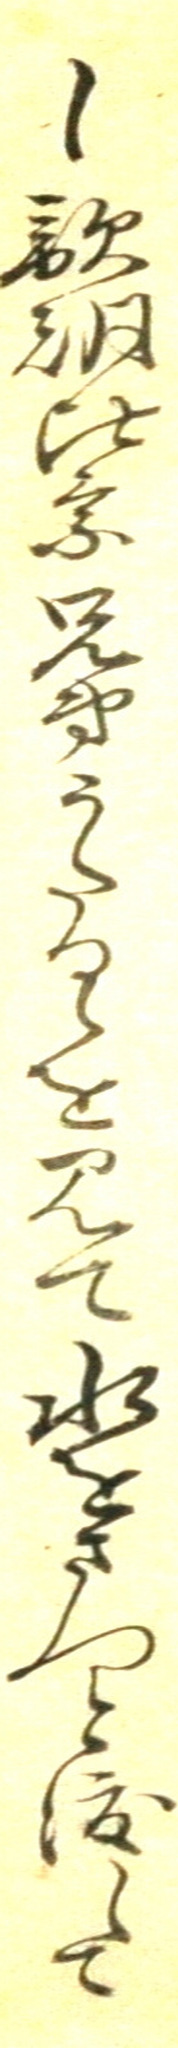し敵朝比奈兄弟うたるゝを見て水をさつと渡して
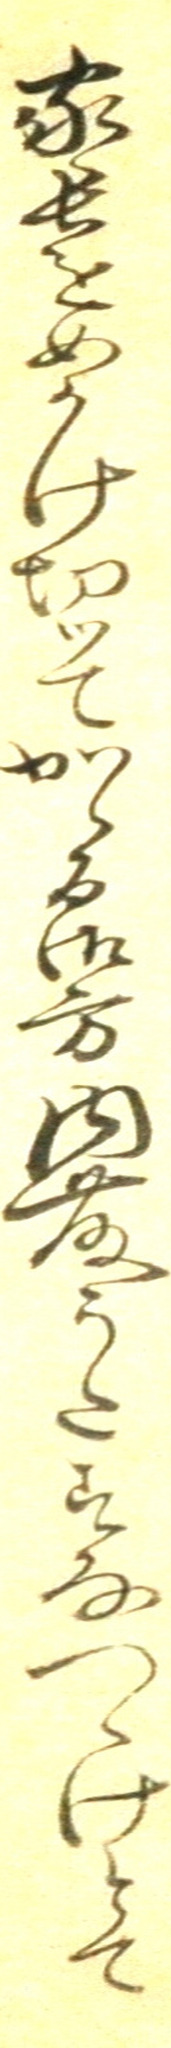家長をめかけ切ツてかゝる御方内藤うたすなつゝけとて
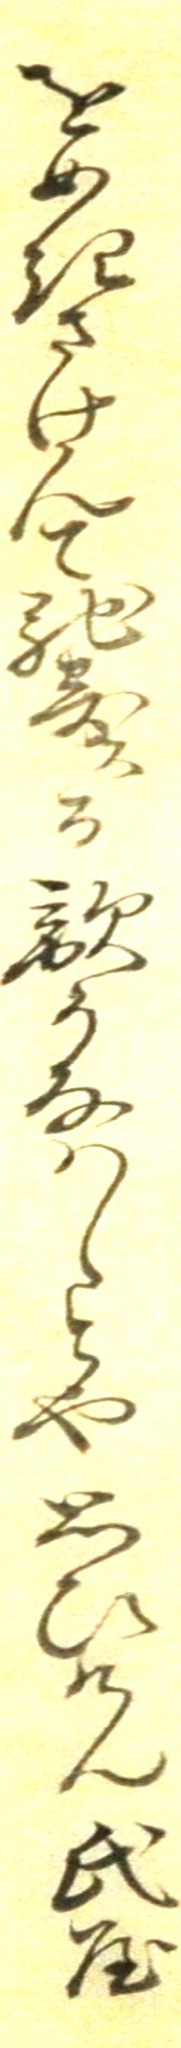をめきさけんて馳寄敵かなはしとや思ひけん氏屋に
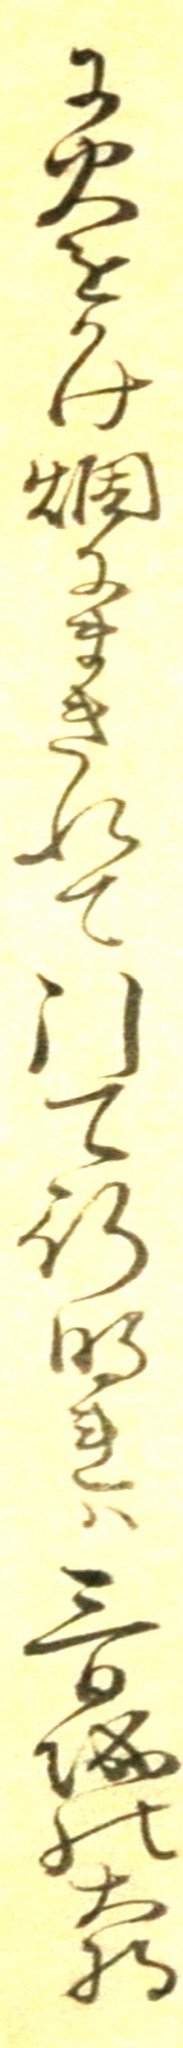に火をかけ烟にまきれて引て行明れは三日城の大将
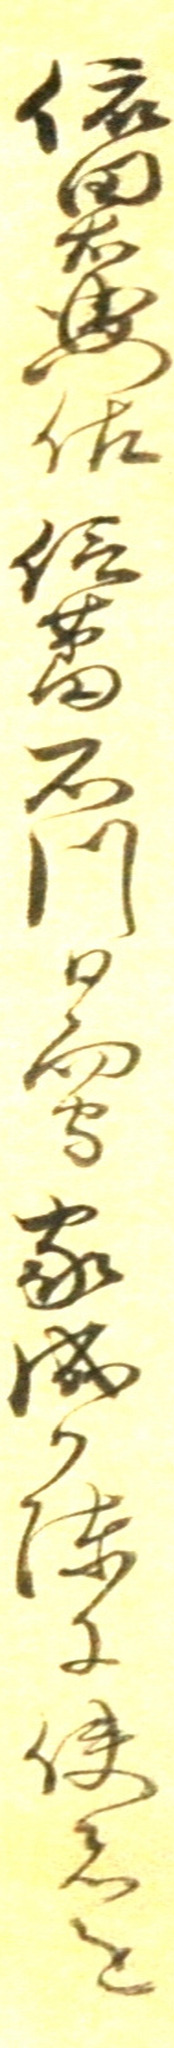依田右衛門佐信蕃石川日向守家成か陣に使者を

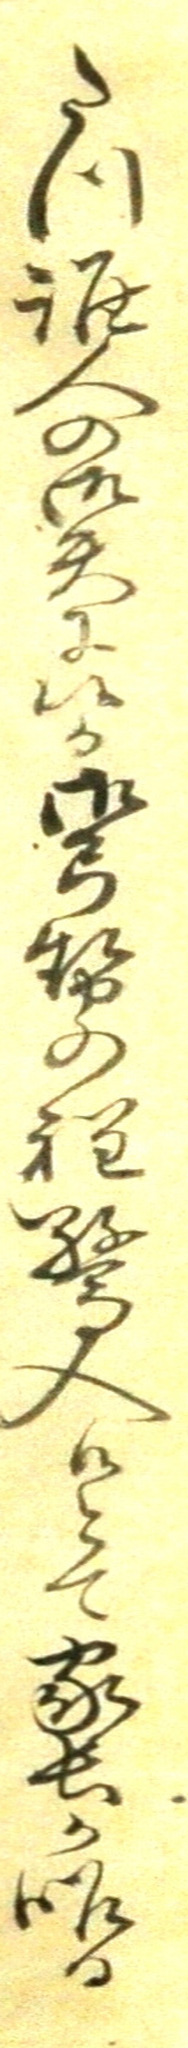たつ誰人の御矢に候か御弓勢の程驚入候とて家長か昨日
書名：藩翰譜（四・中）
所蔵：伊那市立高遠町図書館・合同会社AMANE
